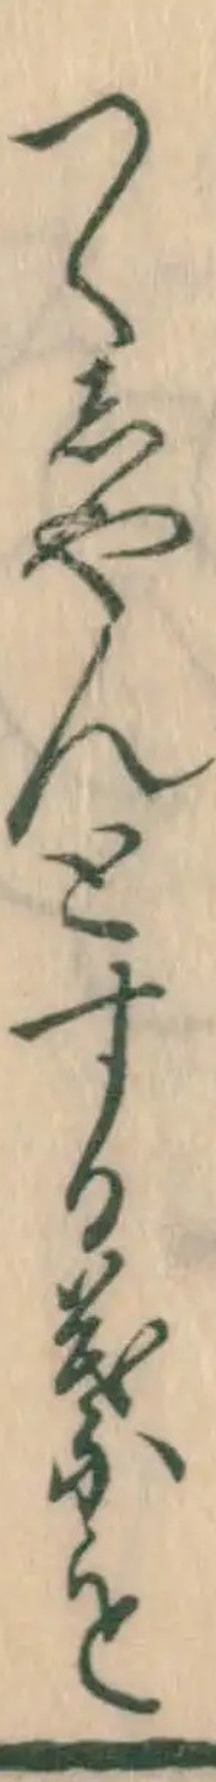つくしやんとする葉も
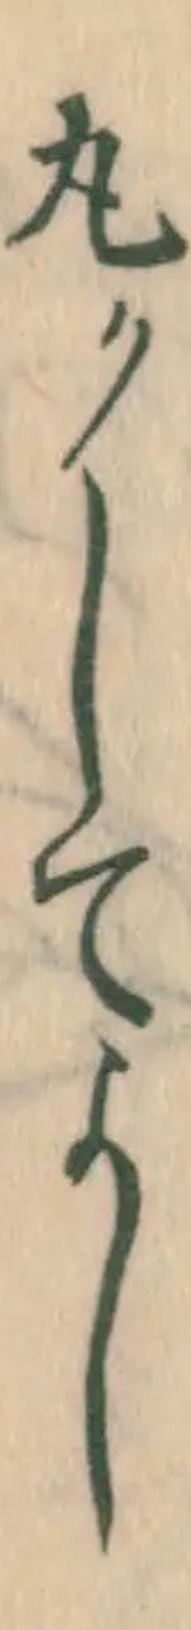丸くしてよし
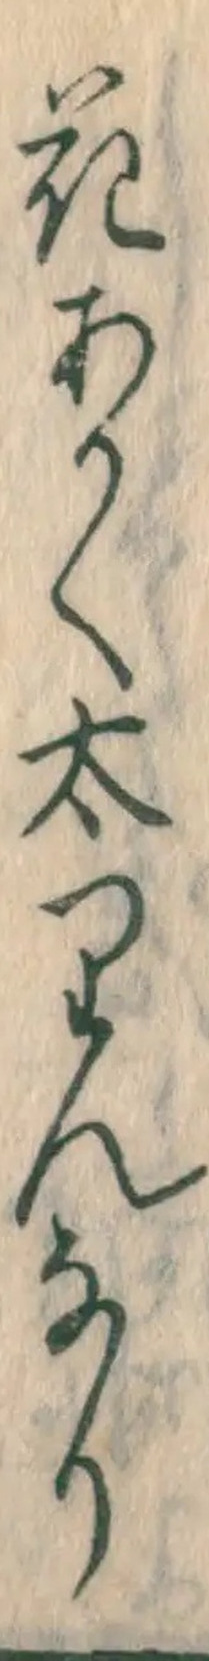花あかく太りんなり
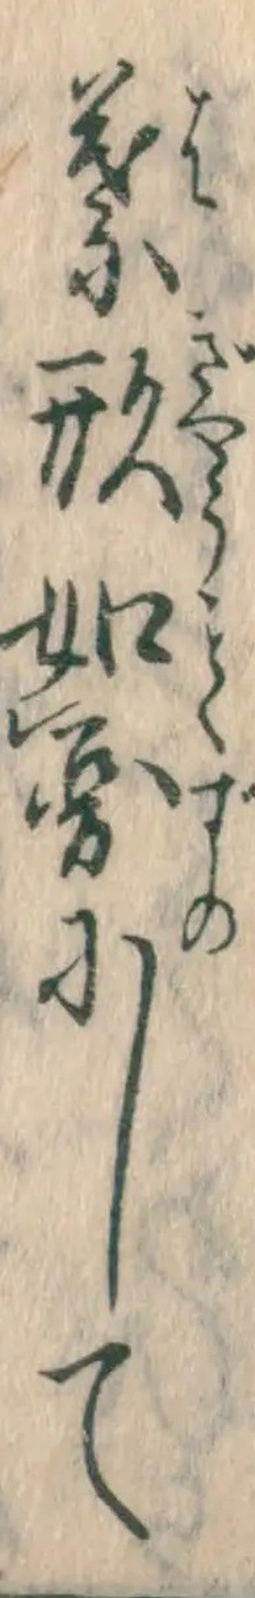葉形如図にして
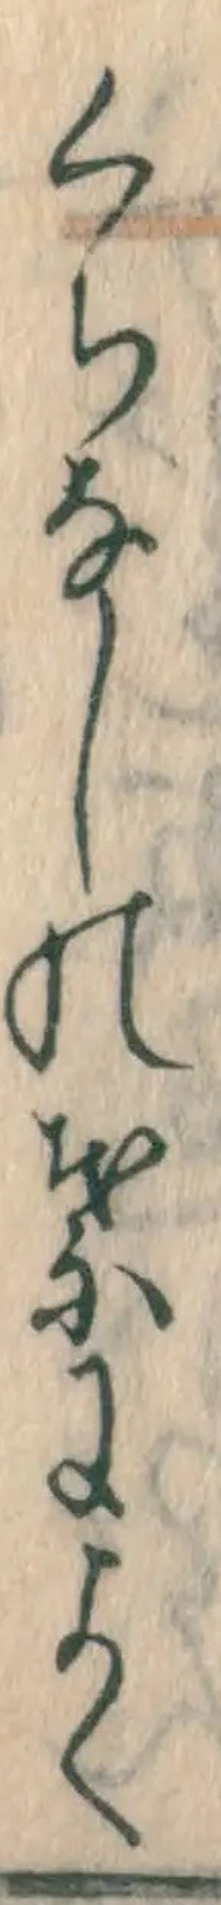くちなしの葉によく
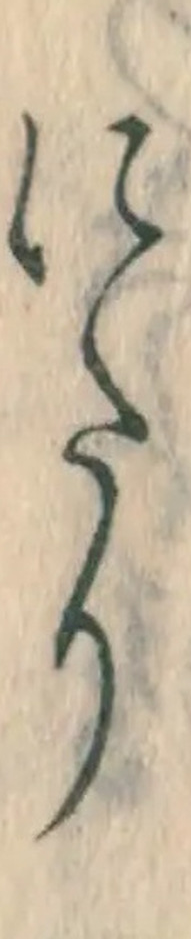にたり

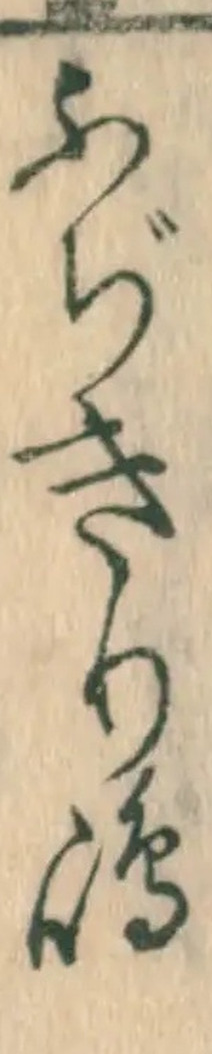ふぢきり嶋
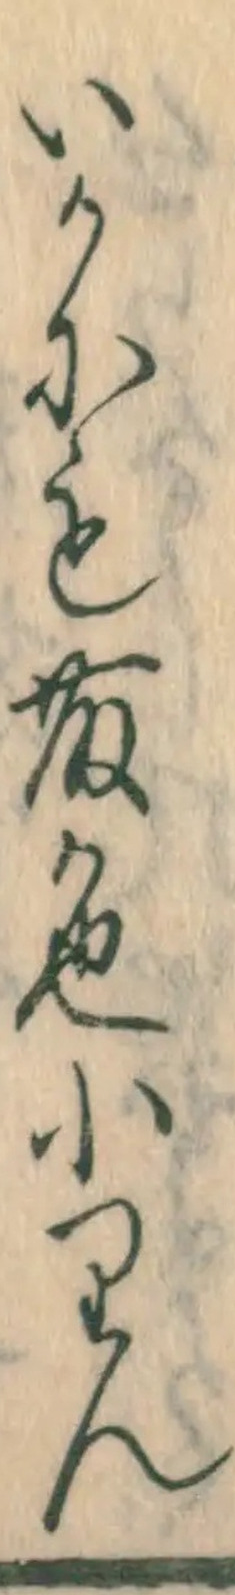いかにも藤色小りん
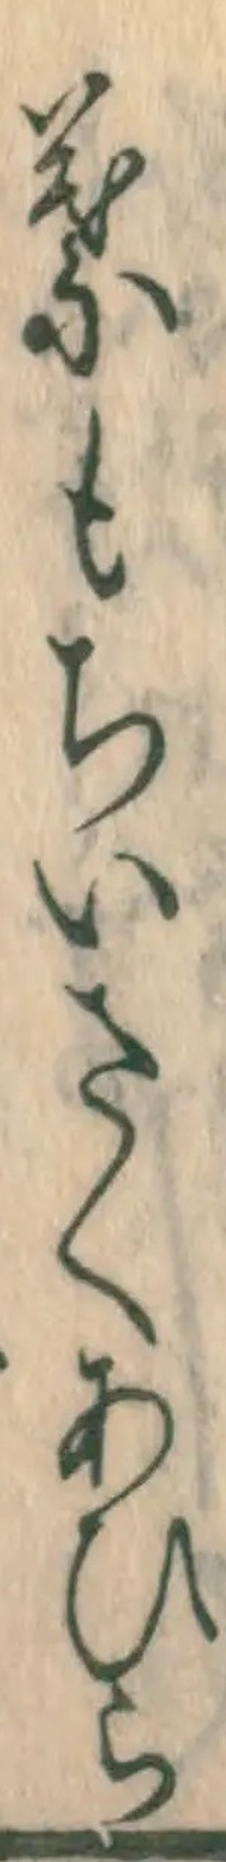葉も小さくあひら
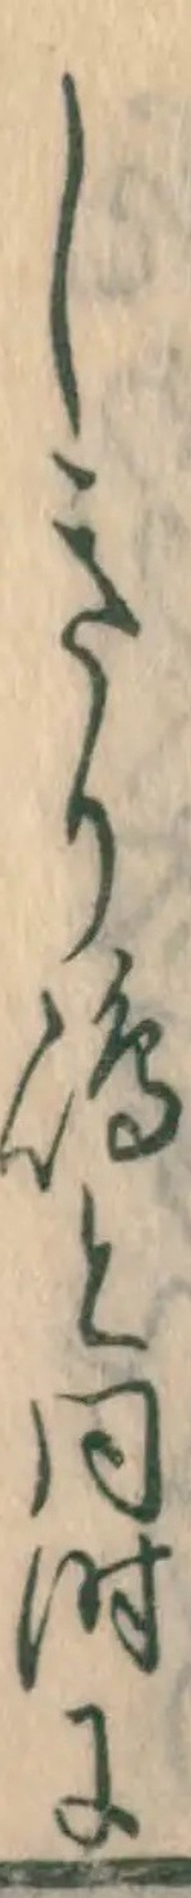しきり嶋と同時に
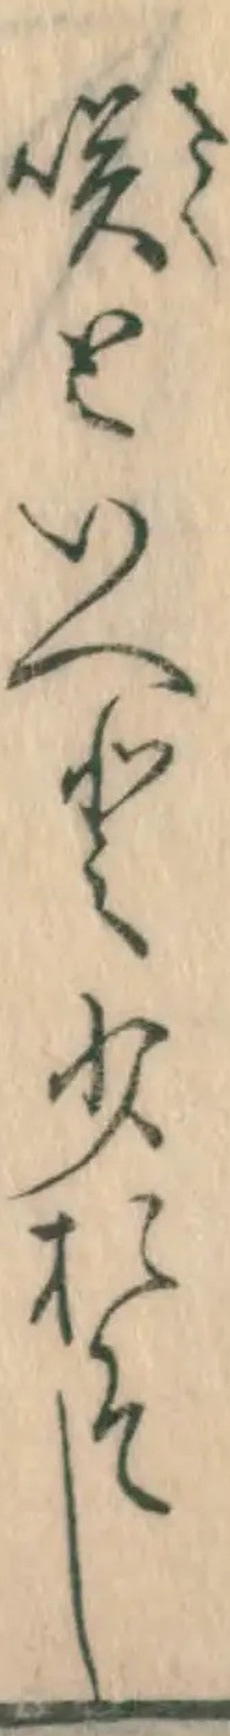咲といへと少おそし
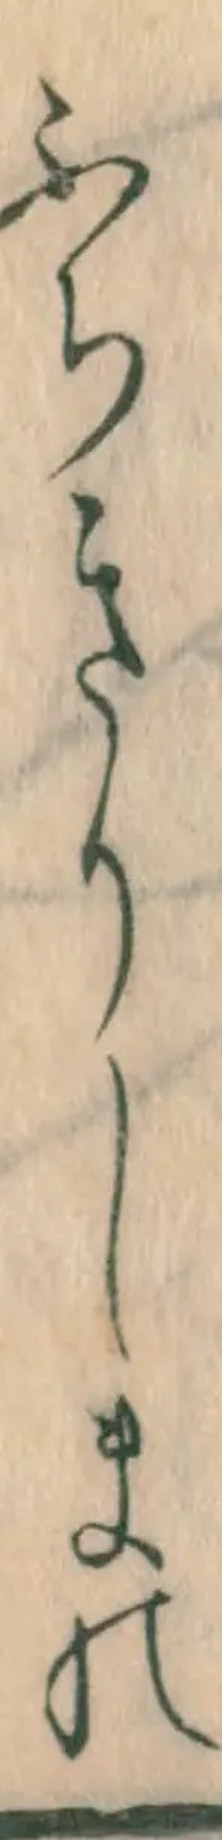ふちきりしまの
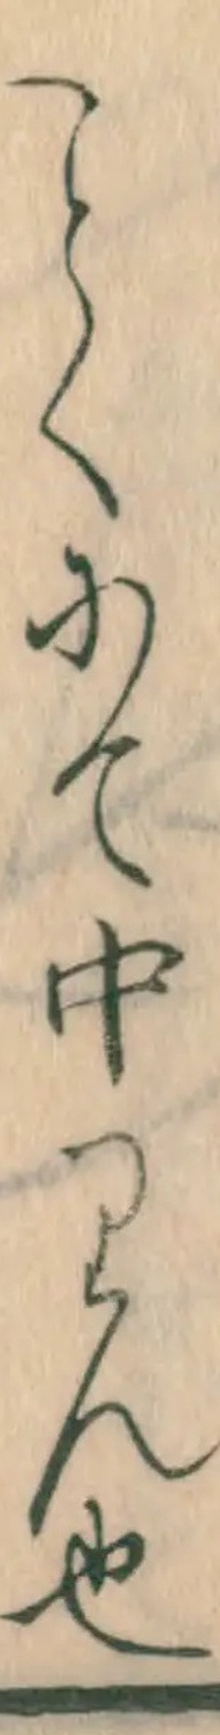ことくにて中りん也
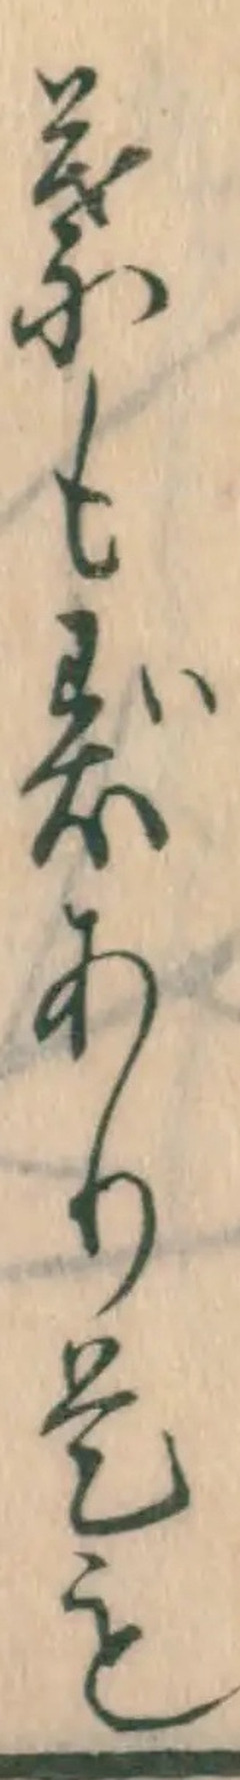葉も異あり是も
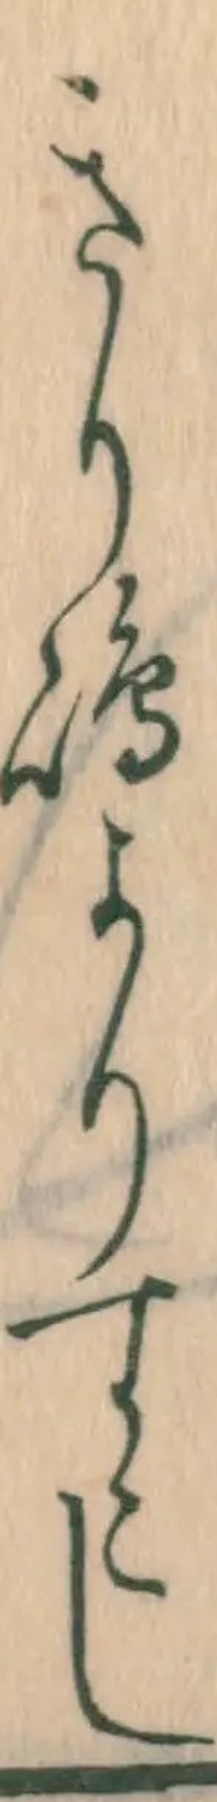きり嶋よりすこし
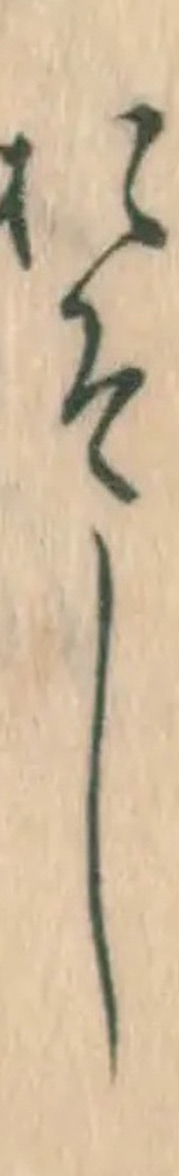おそし
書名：錦繍枕 5巻. [1]
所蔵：国立国会図書館 National Diet Library, JAPAN
